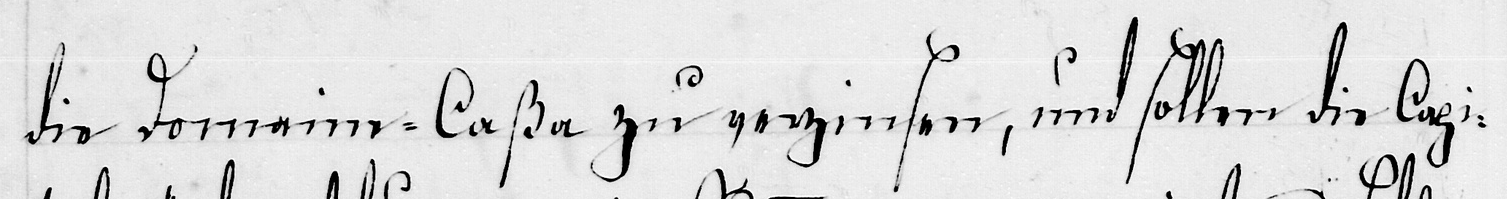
die Domaine-Caßa zu verzinsen, und sollen die Capi¬
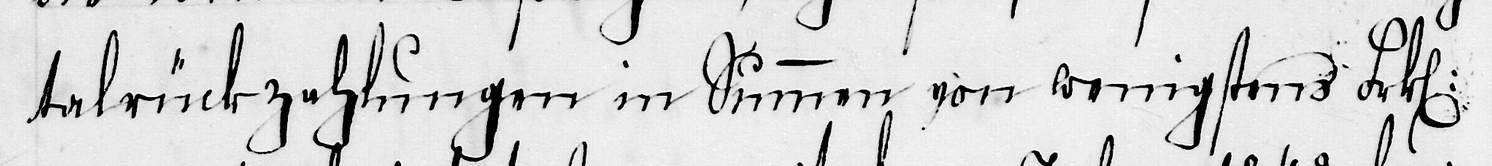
talrückzahlungen in Summen von wenigstens Frk[e¬
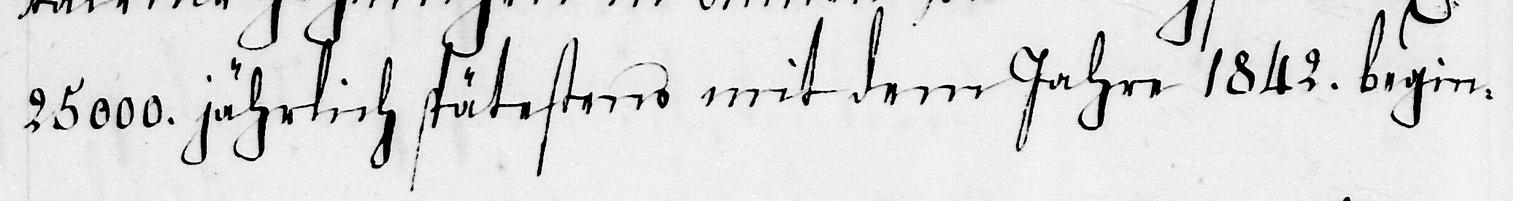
25 000. jährlich spätestens mit dem Jahre 1842. begin¬
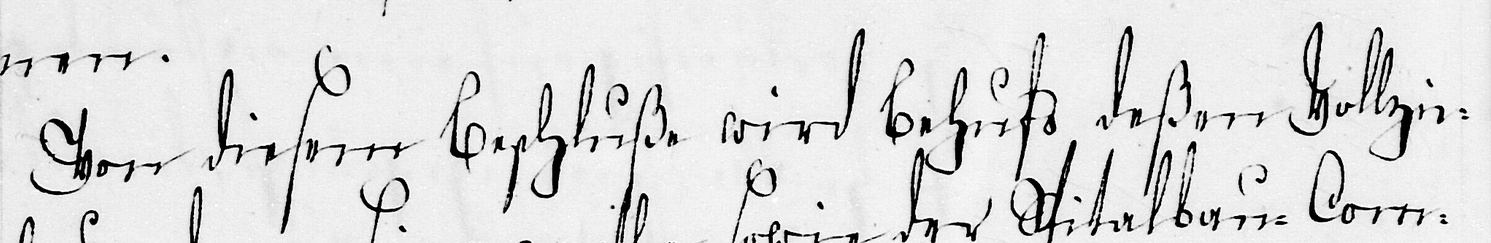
Von diesem Beschluße wird Behufs deßen Vollzi¬
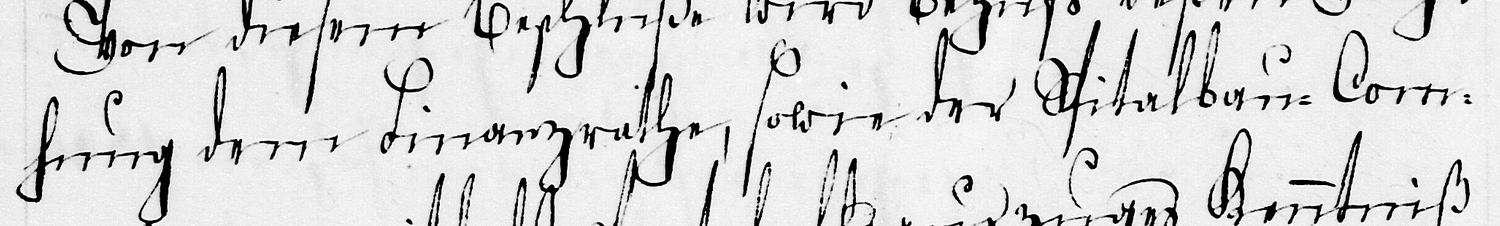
ehung dem Finanzrathe, sowie der Spitalbau-Com¬
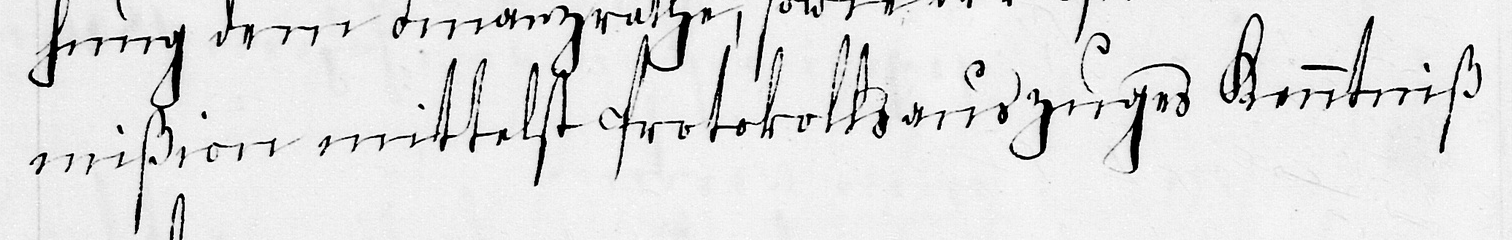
mißion mittelst Protokollsauszuges Kenntniß
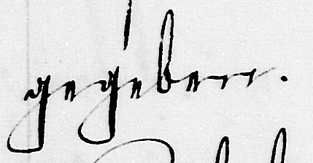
gegeben.
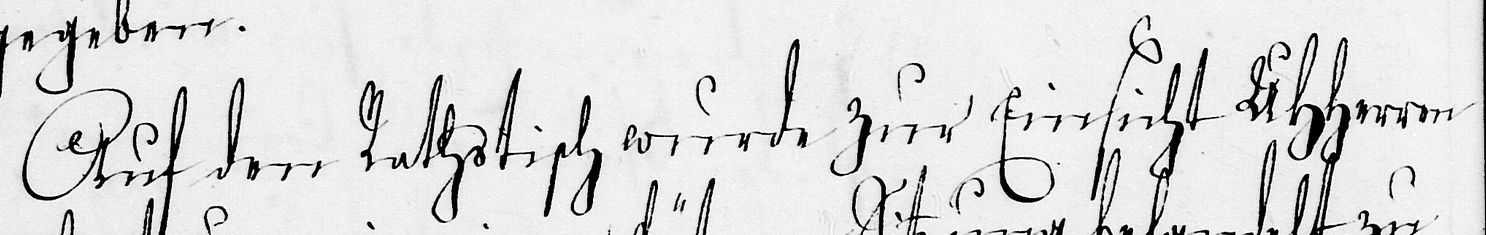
Auf den Rathstisch wurde zur Einsicht UHHerr¬
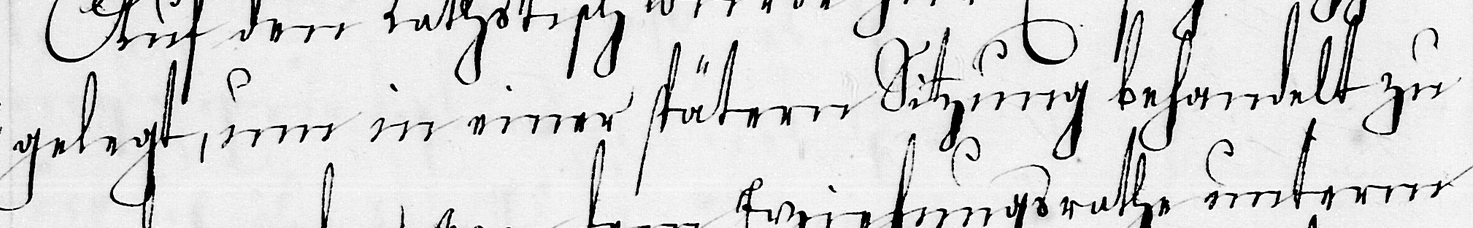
gelegt, um in einer spätern Sitzung behandelt zu
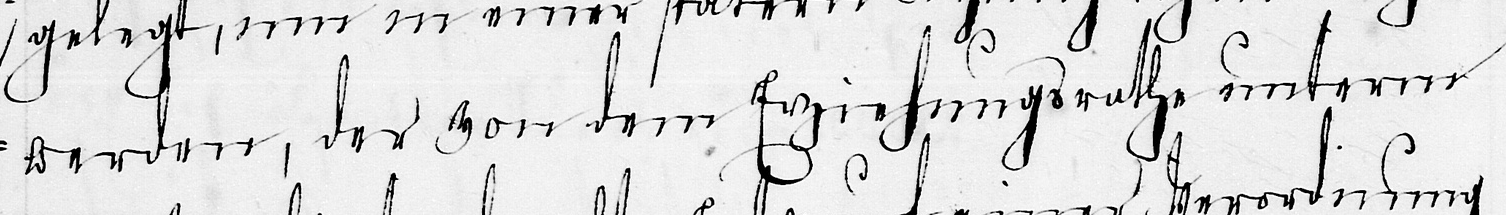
werden, der von dem Erziehungsrathe unterm
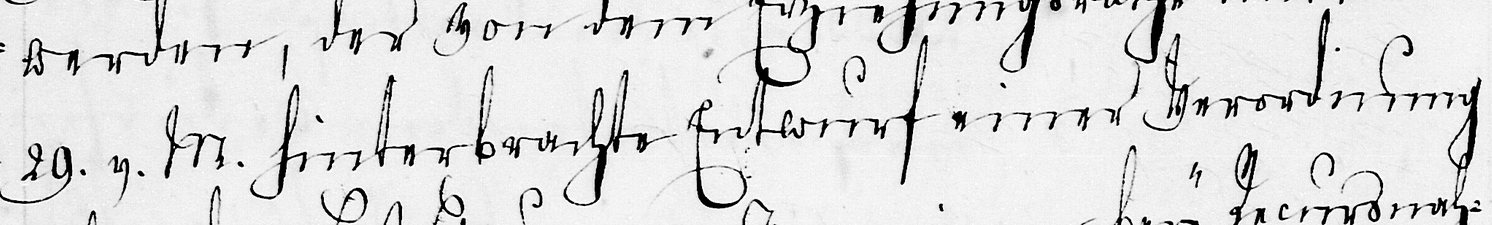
29. v. M. hinterbrachte Entwurf einer Verordnung
